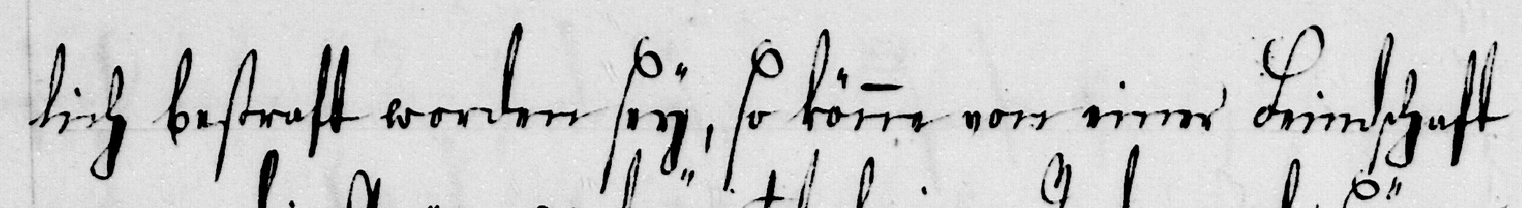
lich bestraft worden sey, so könne von einer Feinschaft
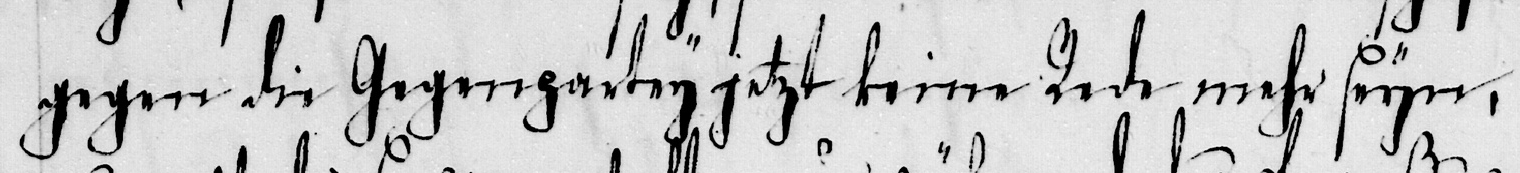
gegen die Gegenpartey keine Rede mehr seyn,
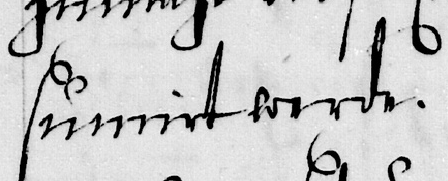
sumirt werde.
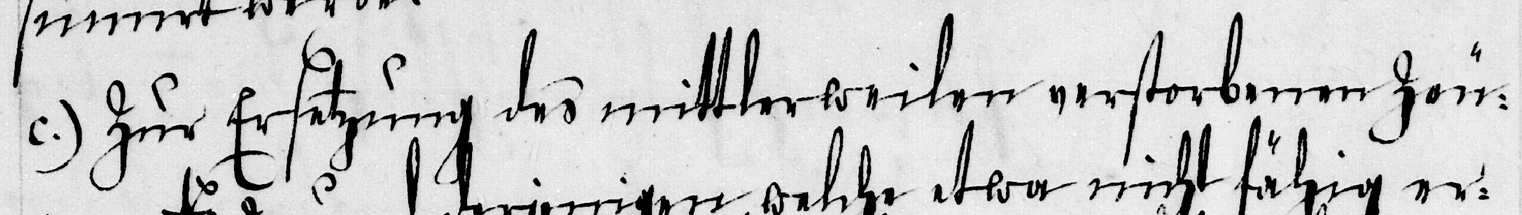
c.) Zur Ersetzung des mittlerweilen verstorbenen Zeu¬
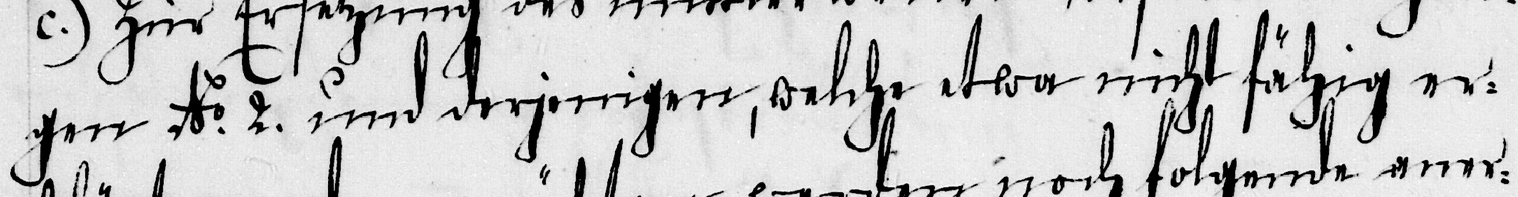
gen No. 2. und derjenigen, welche etwa nicht fähig er¬
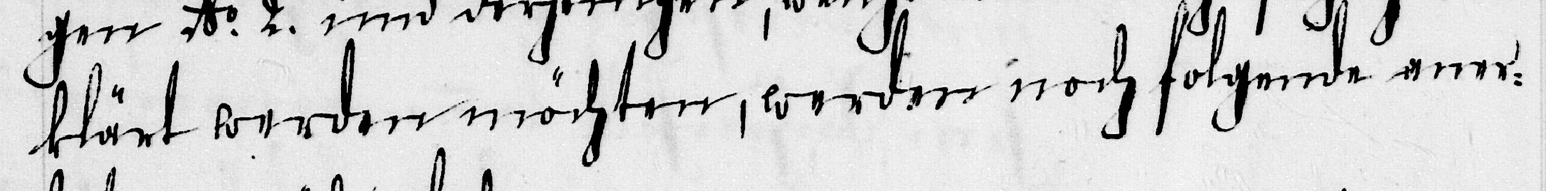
klärt werden möchten, werden noch folgende aner¬
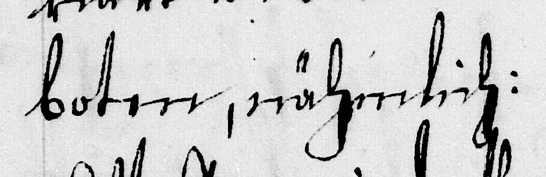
boten, nähmlich:
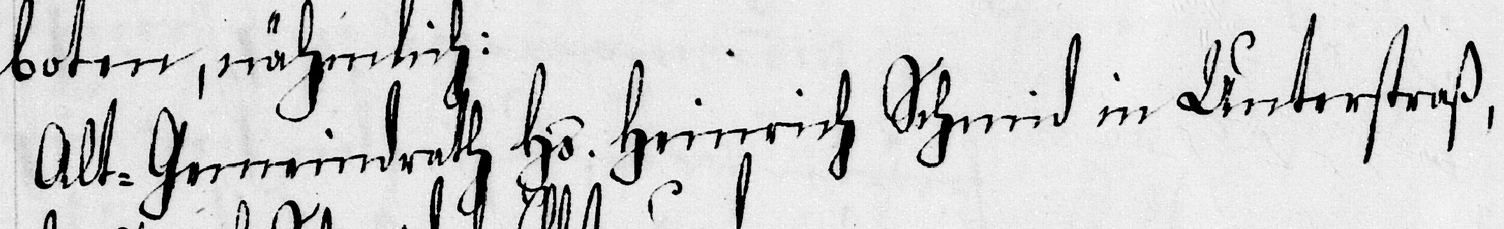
Alt-Gemeindrath Hs. Heinrich Schmid in Unterstraß,
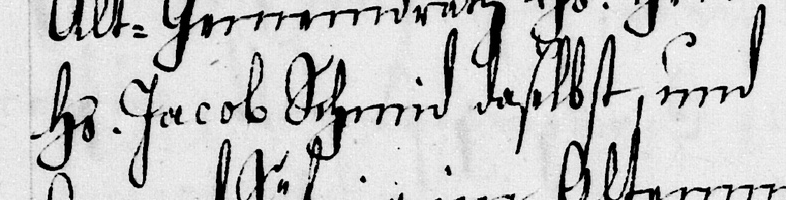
Hs. Jacob Schmid daselbst, und
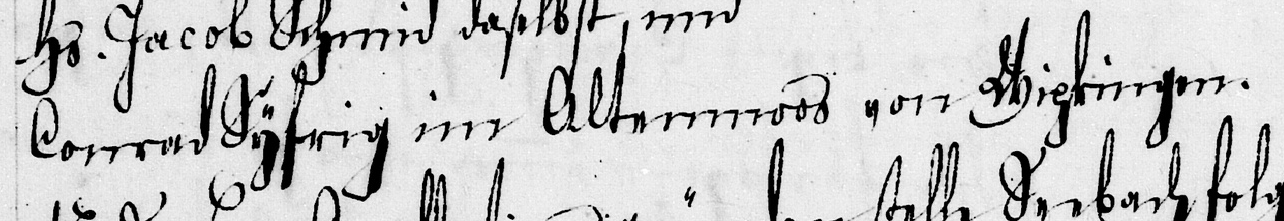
Conrad Syfrig im Altenmoos von Wipkingen.
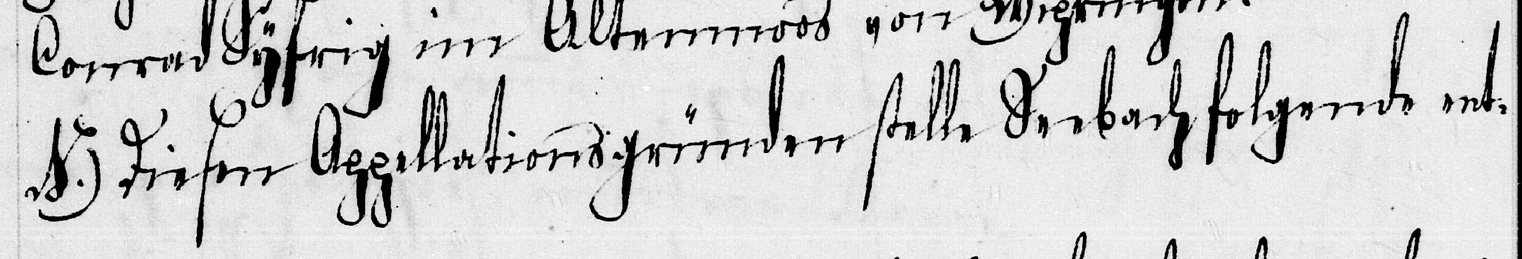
N.) Diesen Appellationsgründen stelle Seebach folgende en¬
